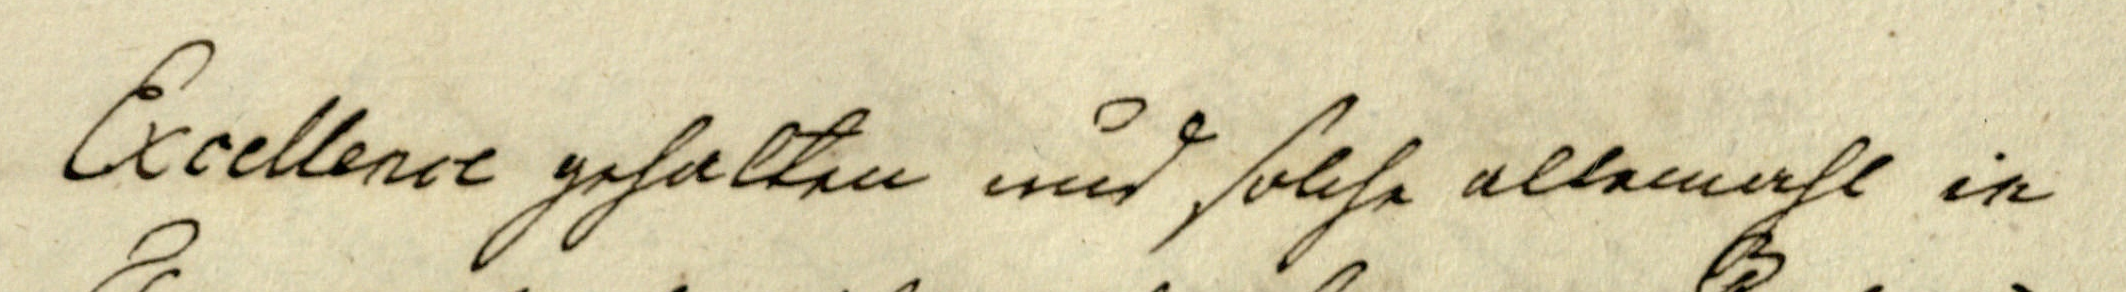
Excellence gehalten und solche allemahl in
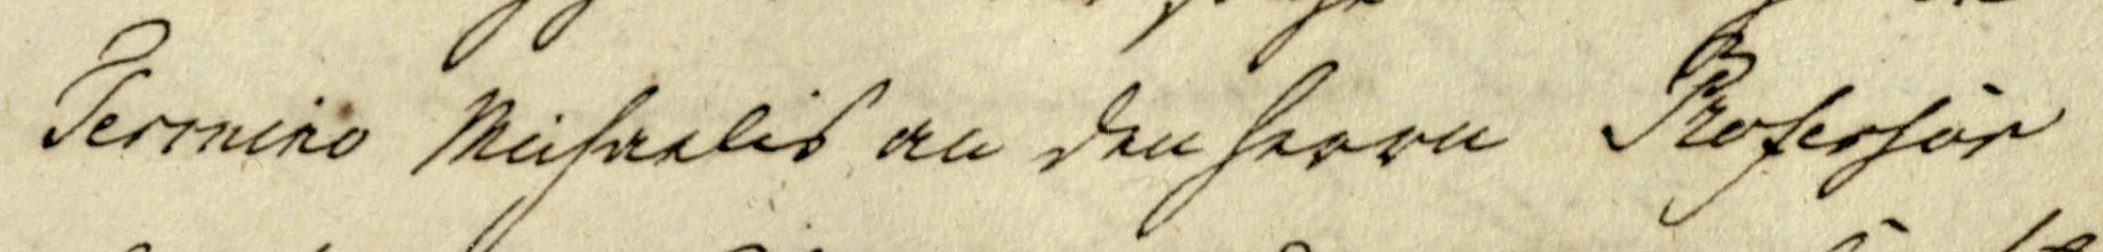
Termino Michaelis an den Herrn Professor
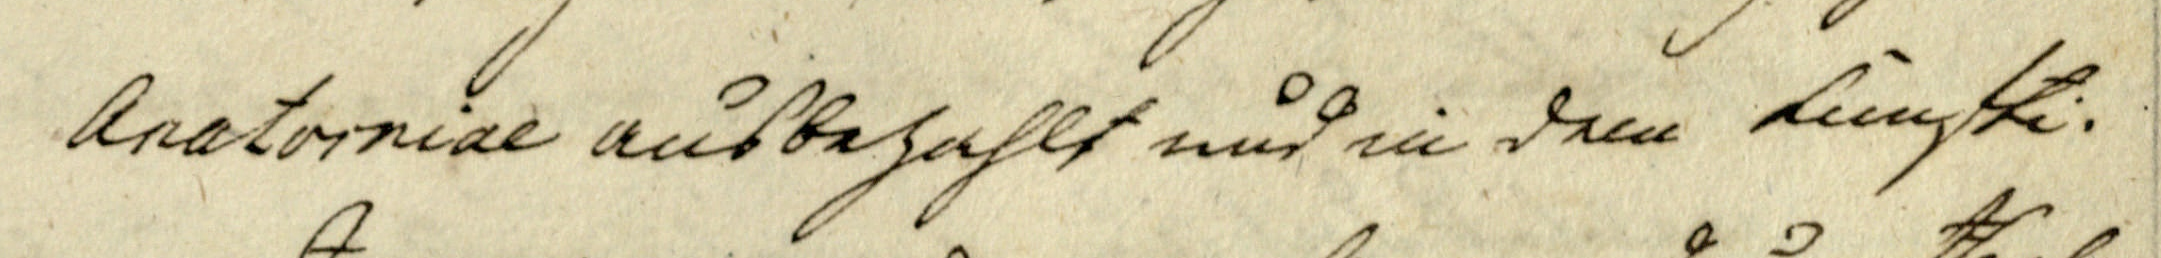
Anatomiae ausbezahlt und in dem künfti¬
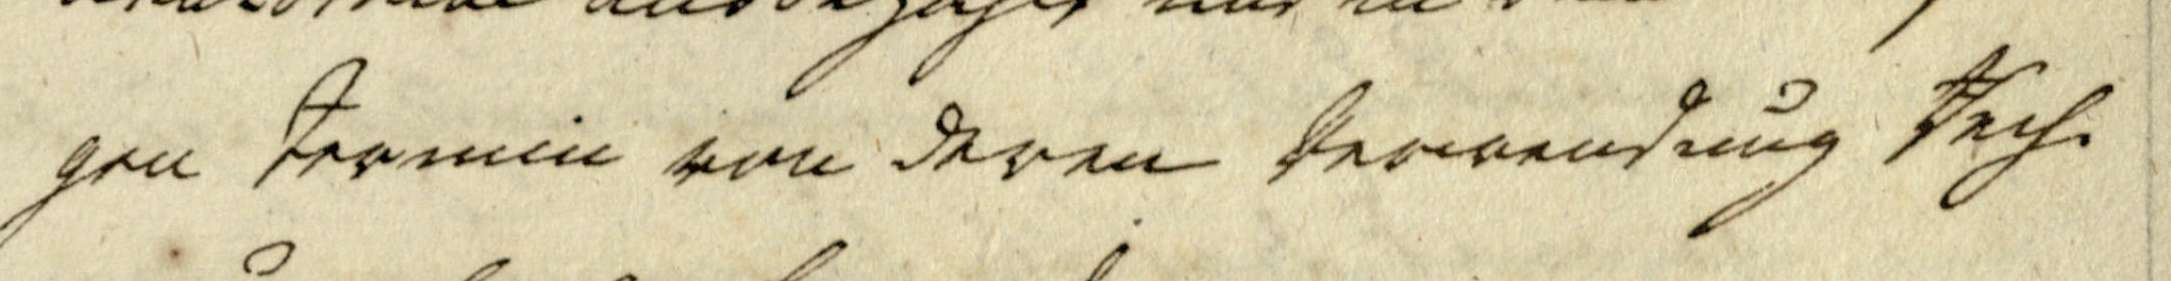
gen Termin von deren Verwendung Rech¬
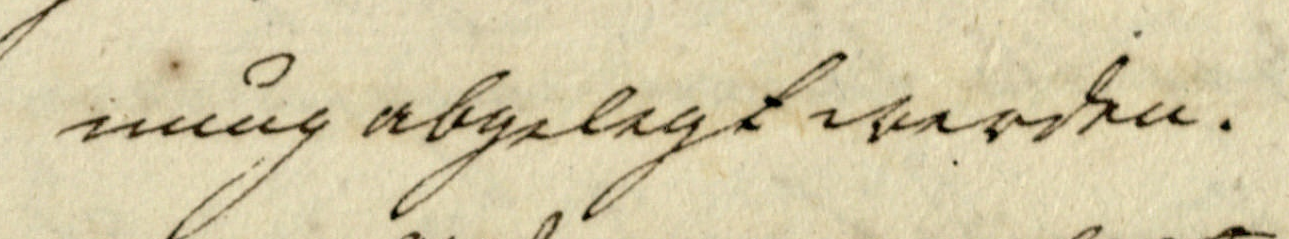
nung abgelegt werden.
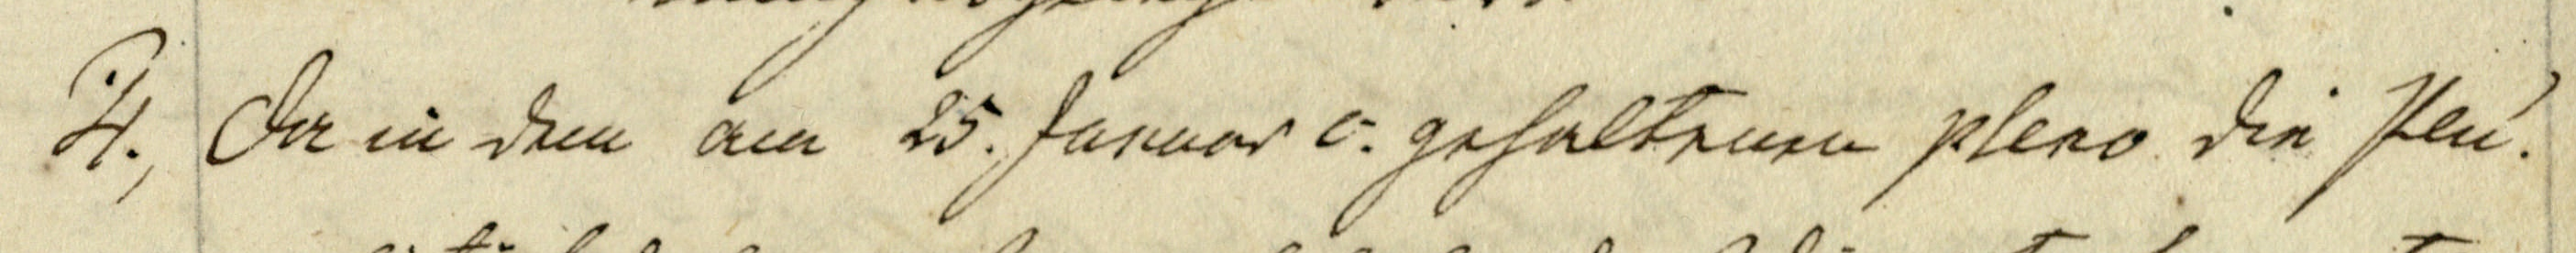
4. Da in dem am 25. Januar c. gehaltenen pleno die Plu¬
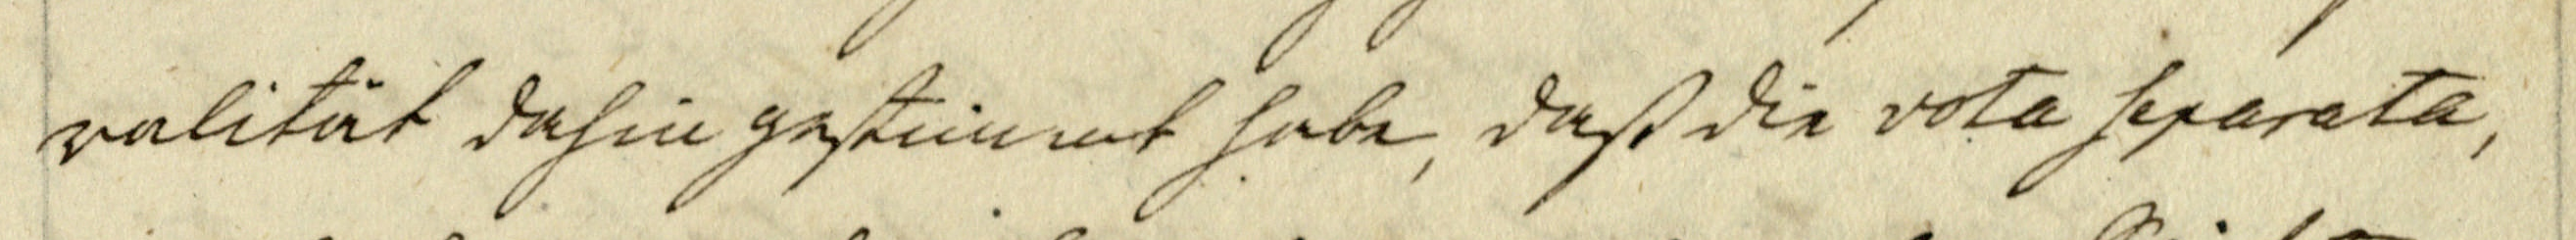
ralität dahin gestimmt habe, daß die vota separata,
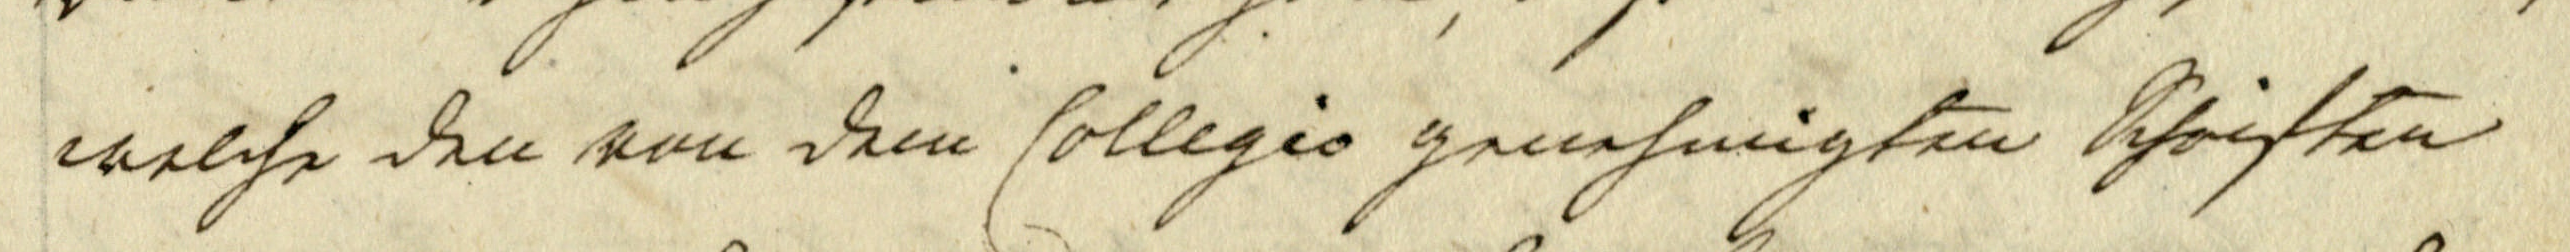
welche den von dem Collegio genehmigten Schriften
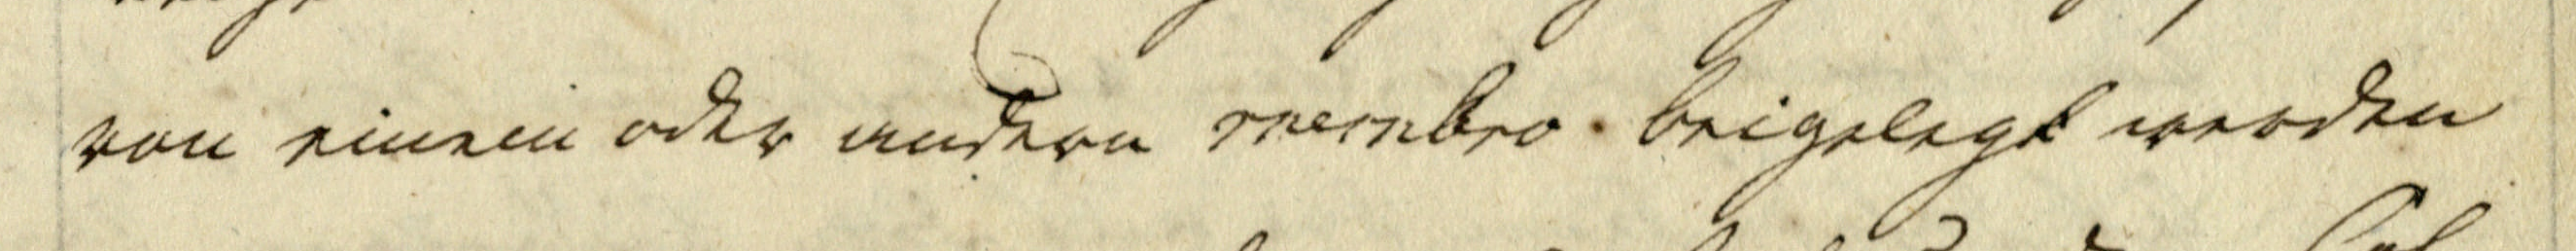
von einem oder andern membro beigelegt werden
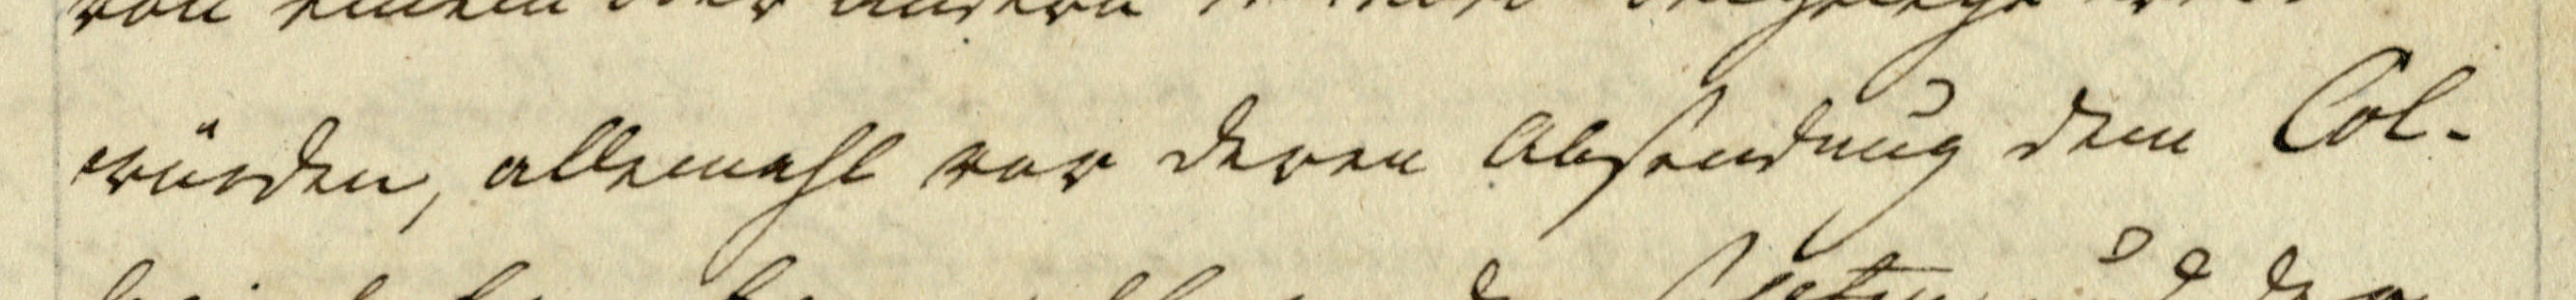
würden, allemahl vor deren Absendung dem Col¬
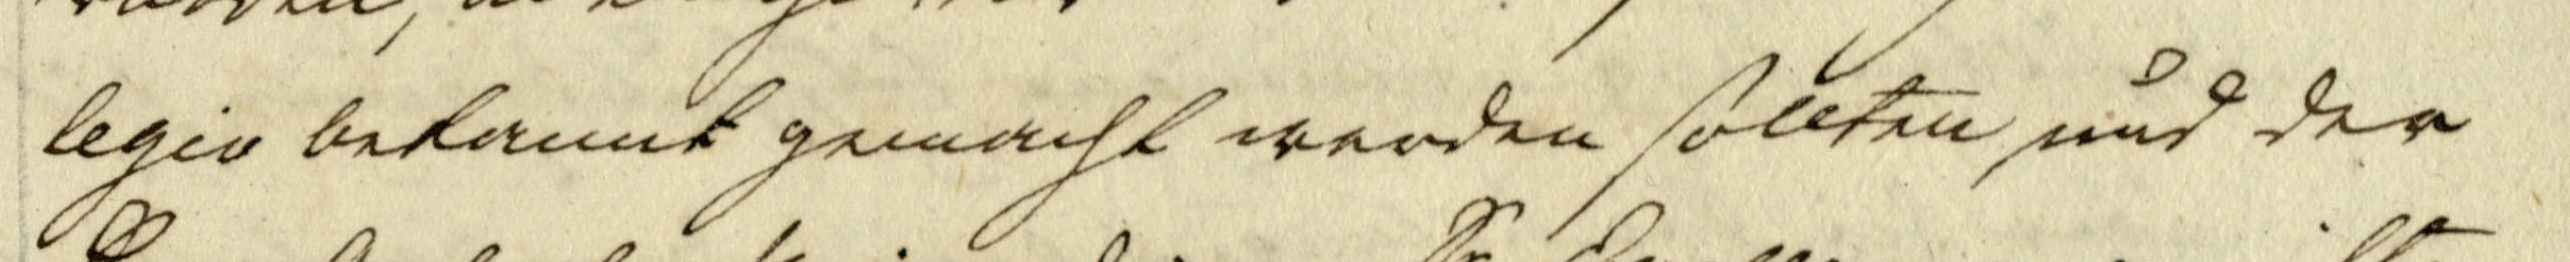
legio bekannt gemacht werden sollten und der
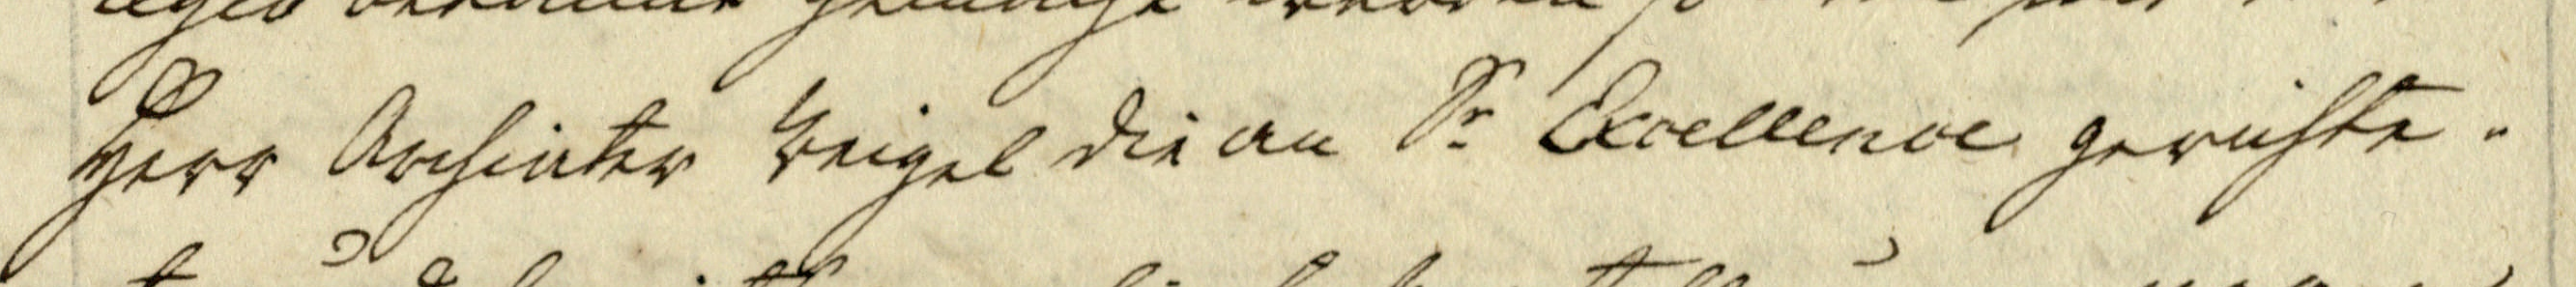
Herr Archiater Weigel die an Sr Excellence gerichte¬
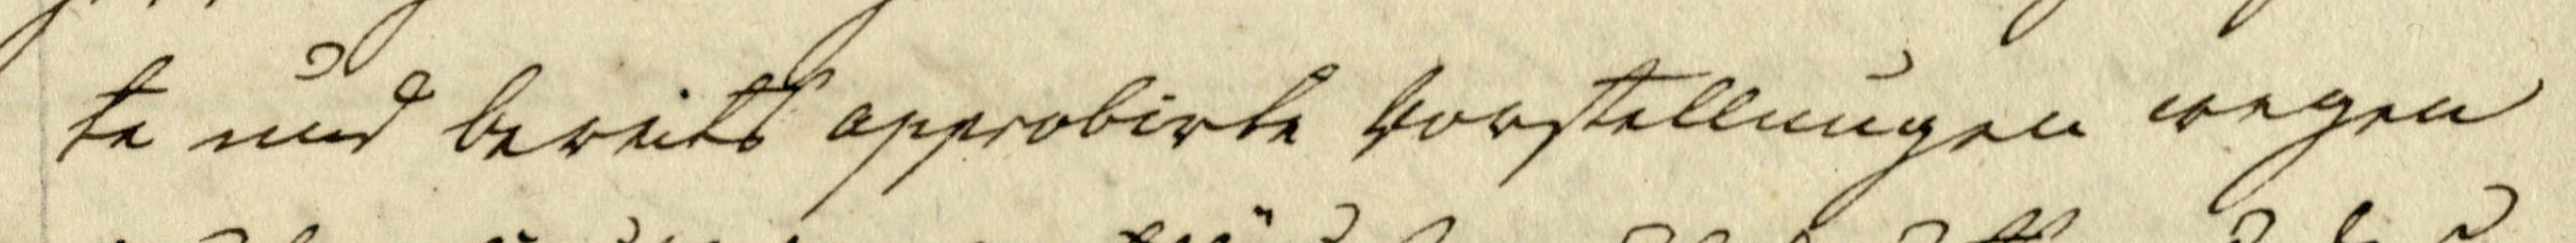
te und bereits approbirte Vorstellungen wegen
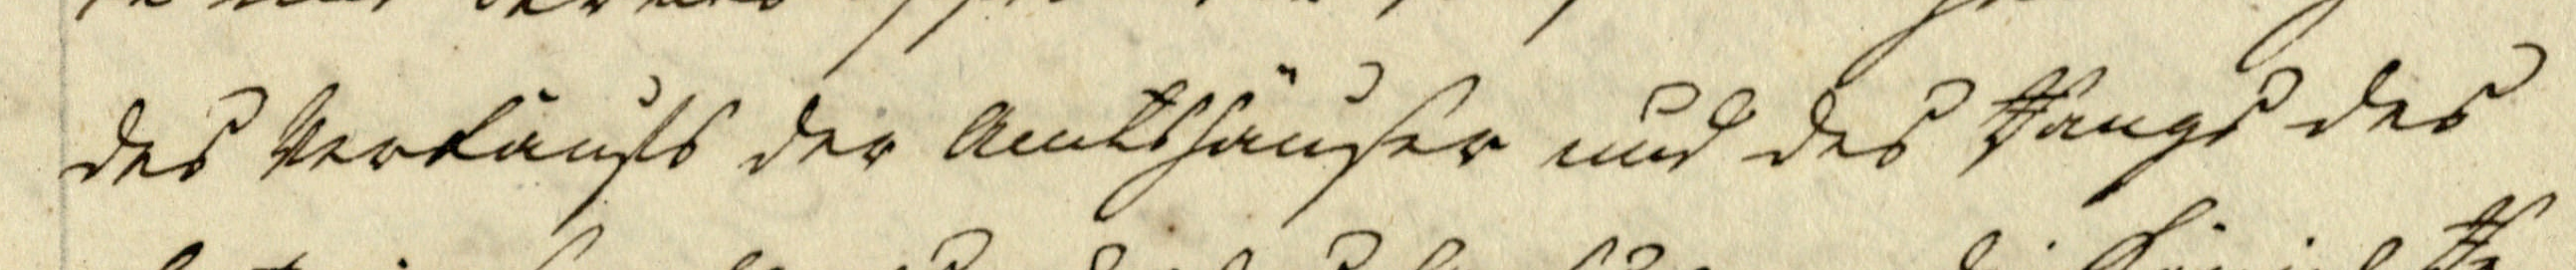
des Verkaufs der Amtshäuser und des Rangs des
